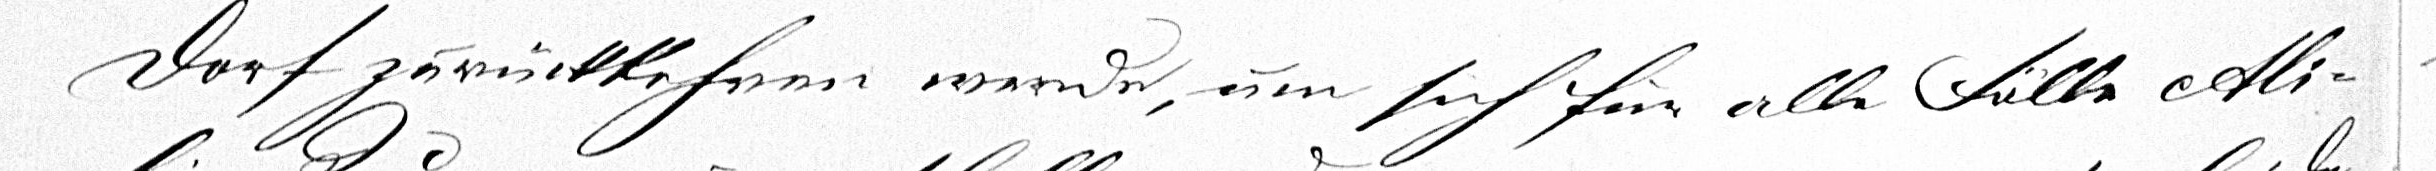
Dorf zurückkehren werde, um sich für alle Fülle Ali¬
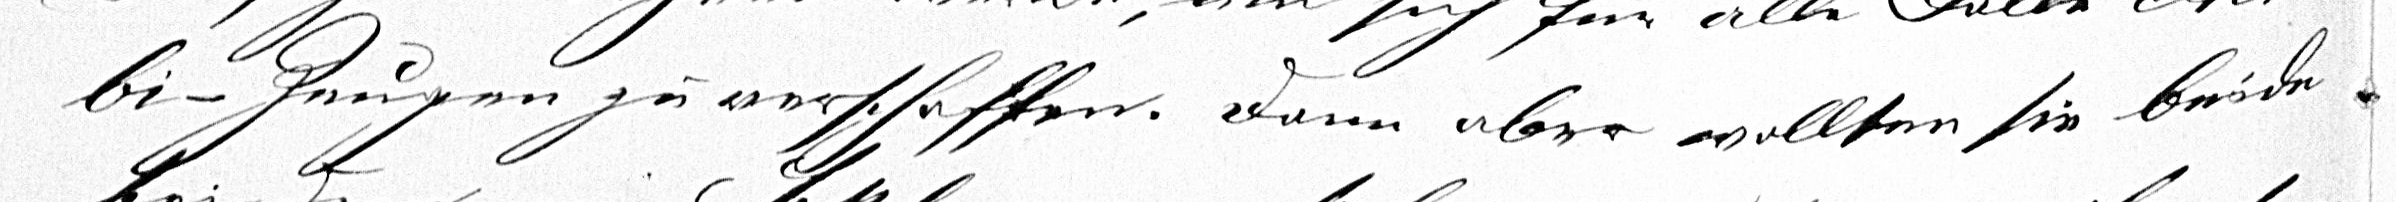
bi-Zeugen zu verschaffen. Dann aber wollten sie beide
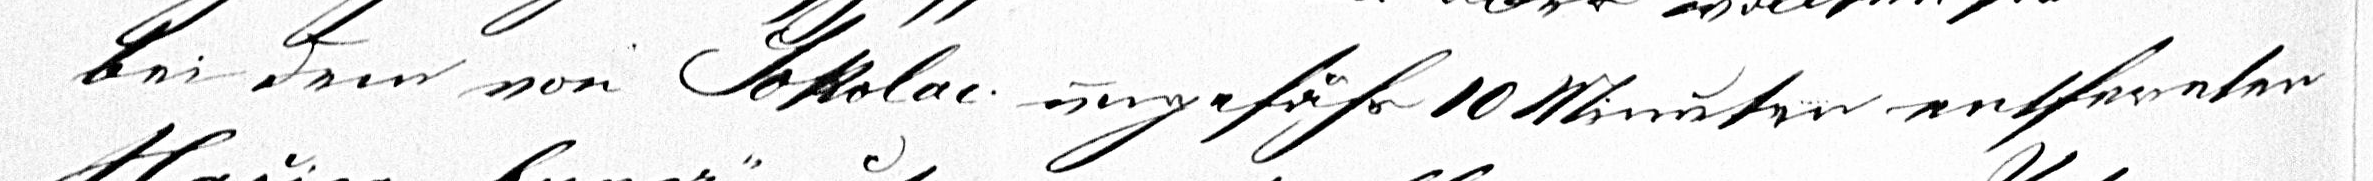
bei dem von Sokolac ungefähr 10 Minuten entfernten
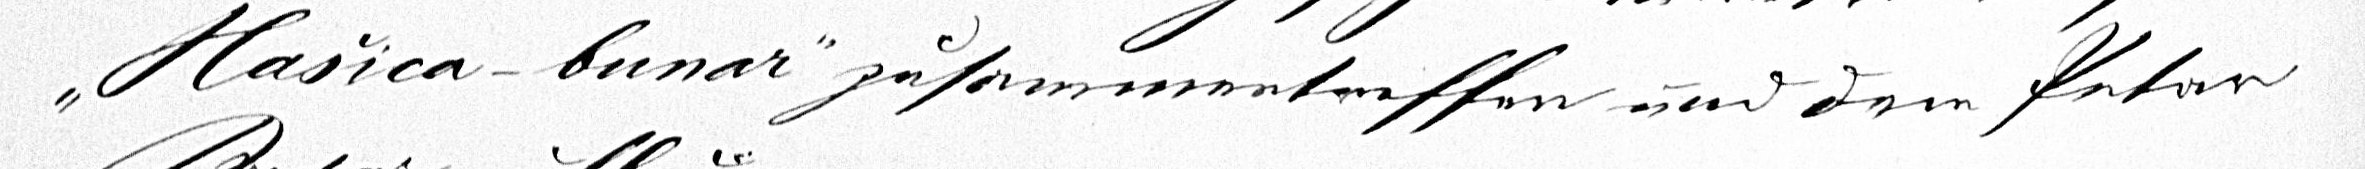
„Hašica-bunar“ zusammentreffen und dem Petar
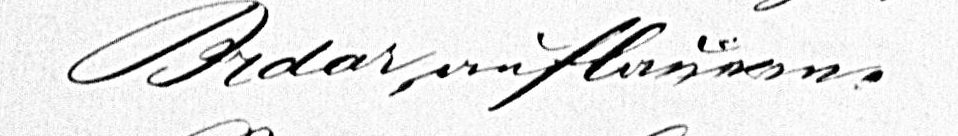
Brdar auflauern.
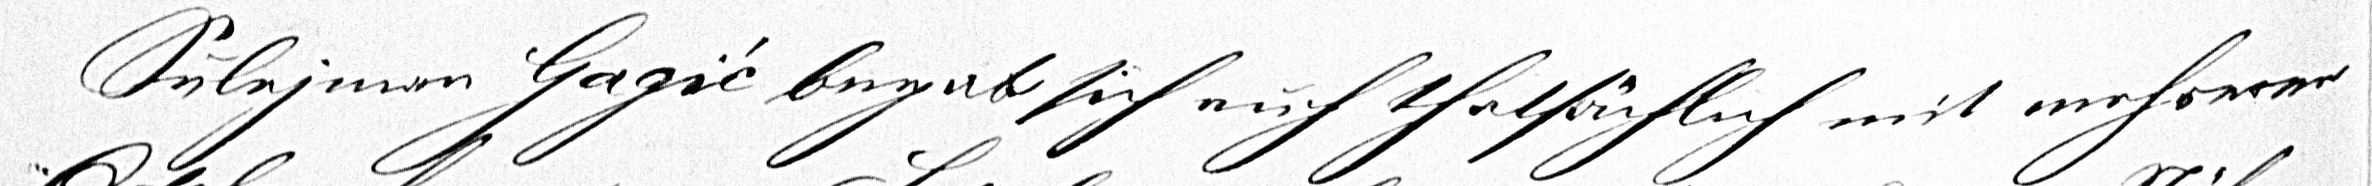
Sulejman Gagić begab sich auf thatsächlich mit mehreren
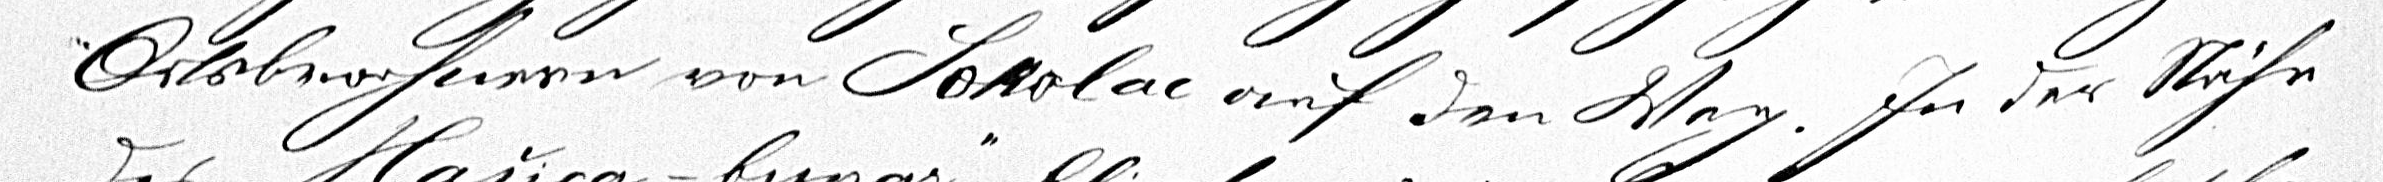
Ortsbrachnern von Sokolac auf den Weg. In der Nähe
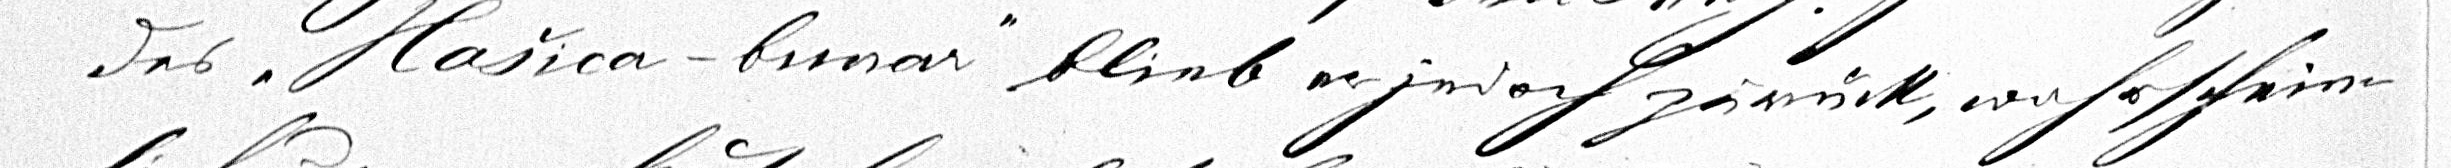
des „Hašica-bunar“ blieb er jedoch zurück, wahrschein¬
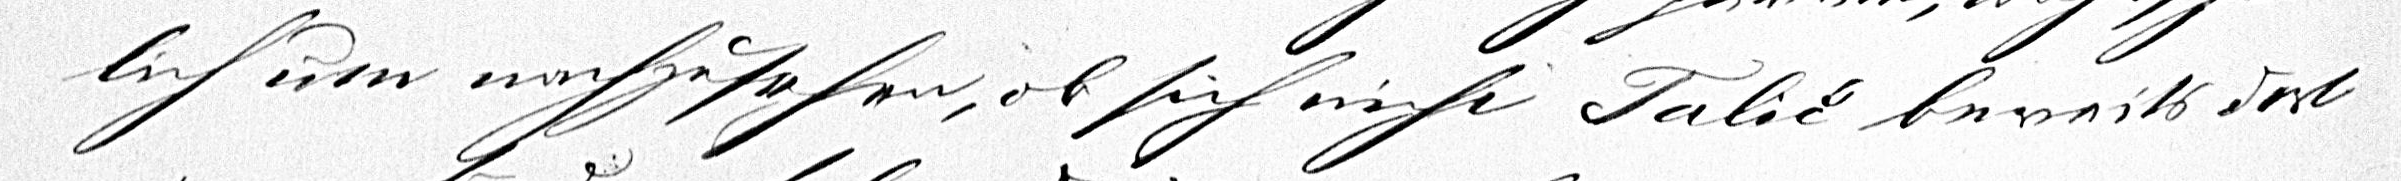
lich um nachzusehen, ob sich nicht Talić bereits dort
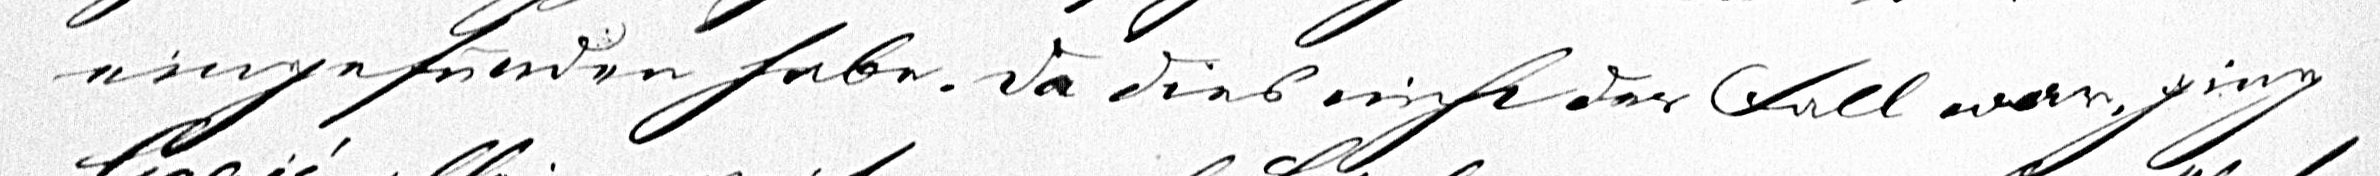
eingefunden habe. Da dies nicht der Fall war, ging
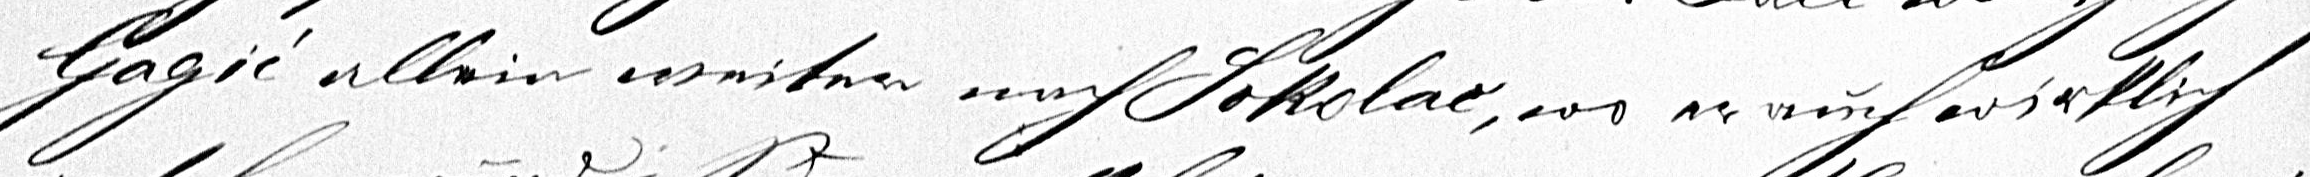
Gagić allein weiter nach Sokolac, wo er auch wirklich
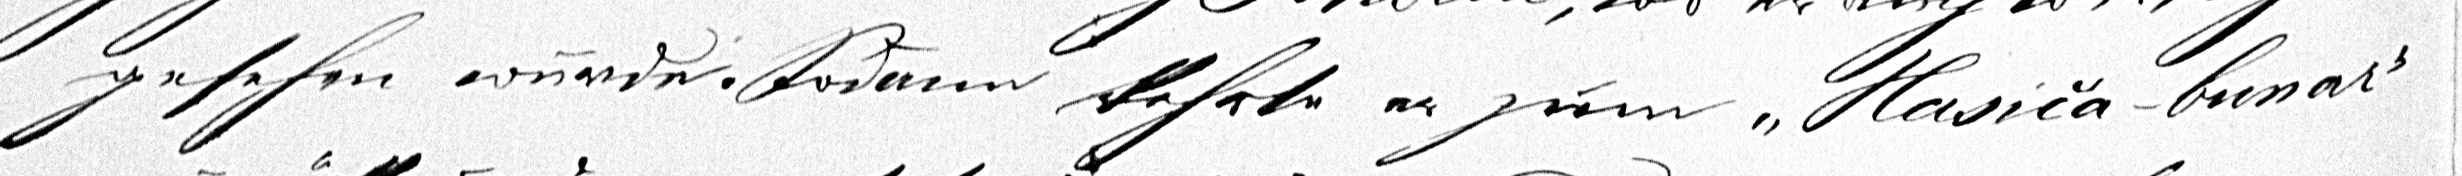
gesehen wurde. Sodann kehrete er zum „Hausiča-bunar“
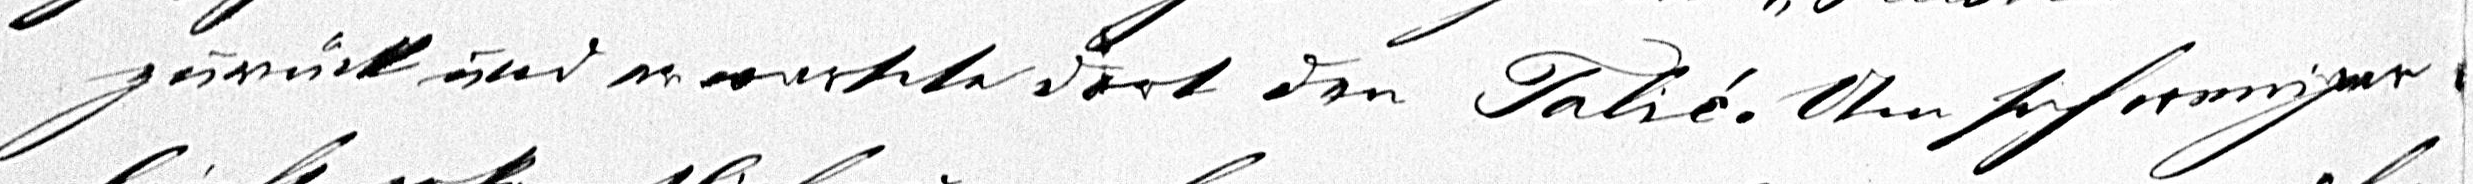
zurück und er wartete dort den Talić. Am schweniger
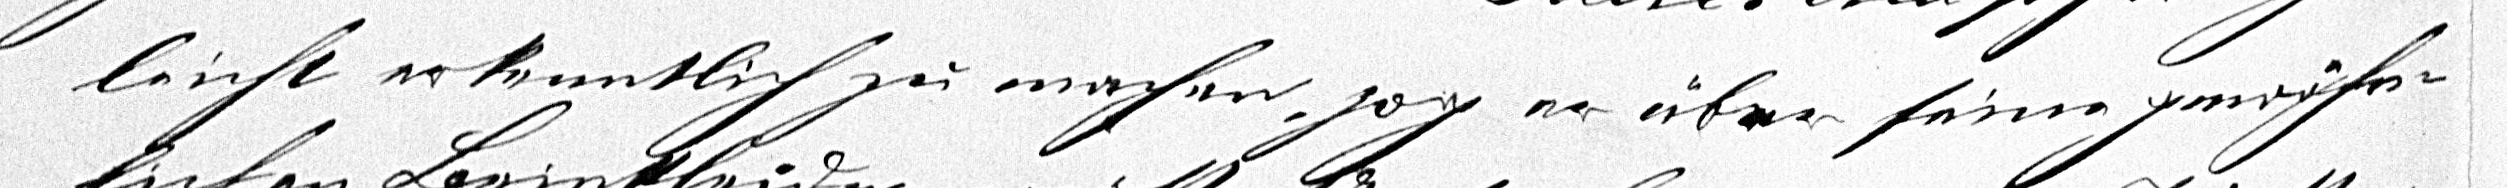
leicht erkenntlich zu machen, sog er über seine gewöhn¬
